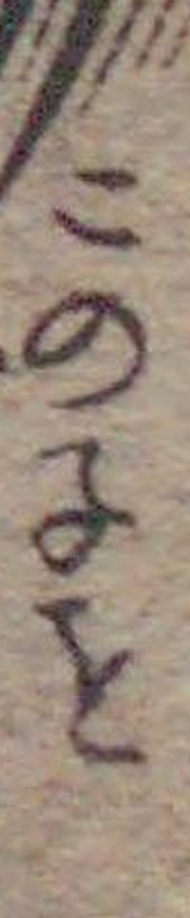この子を
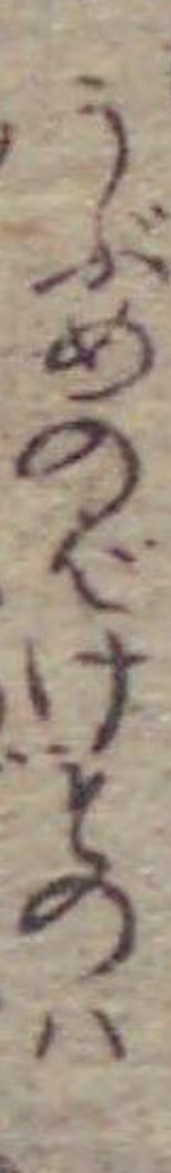うぶめのばけものは
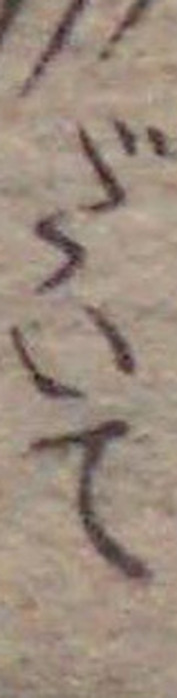だいて
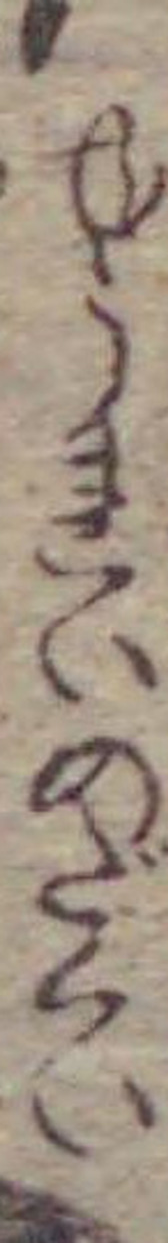ゆうれいのだくい
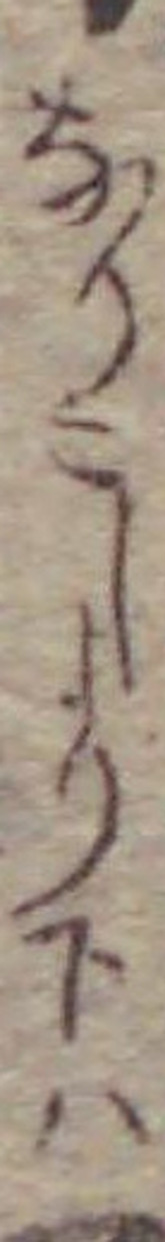なりこしより下は
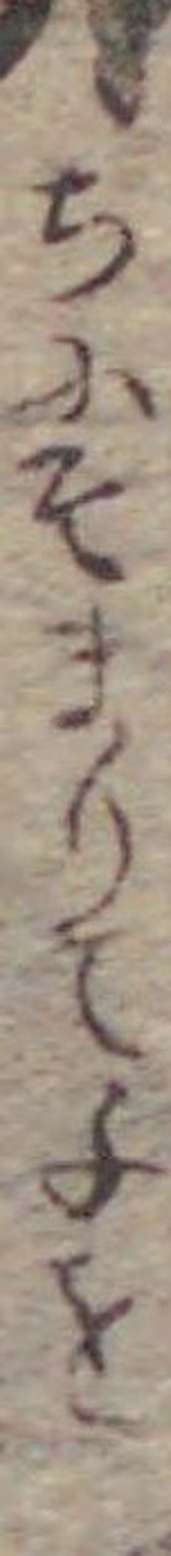ちにそまりて子を
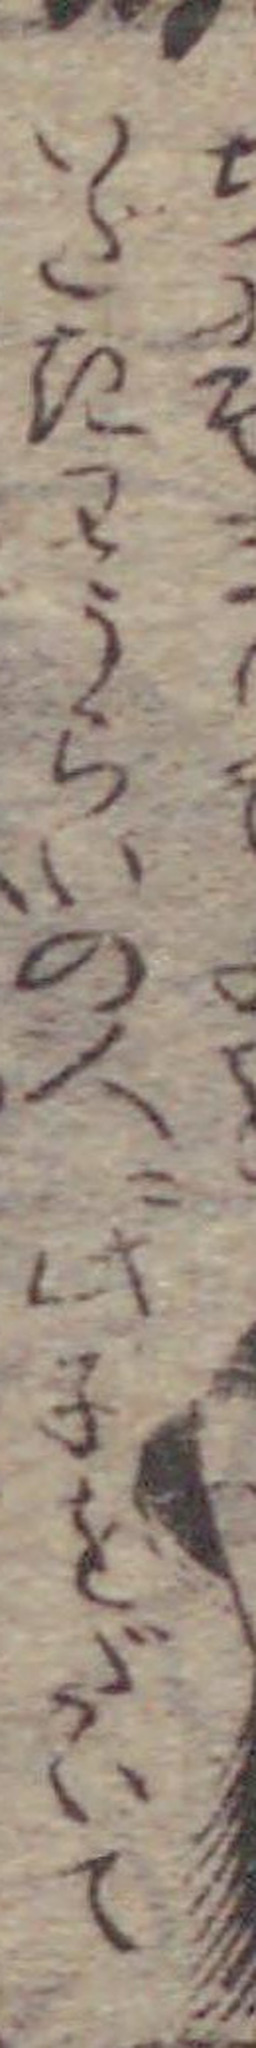いだきわうらいの人に此子をだいて
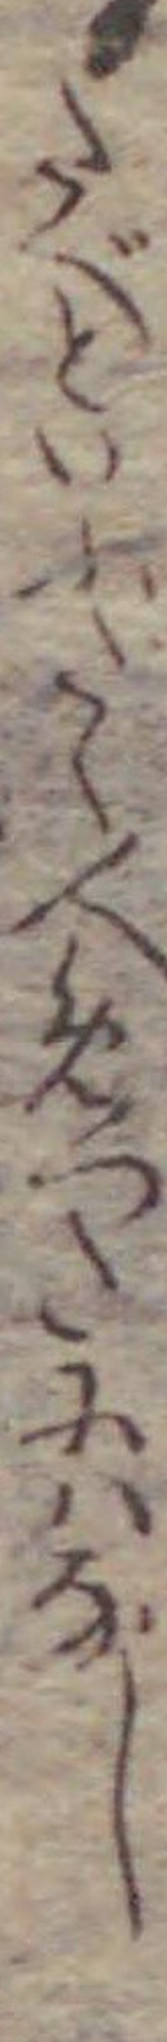たべといふだく人めつたにはなし
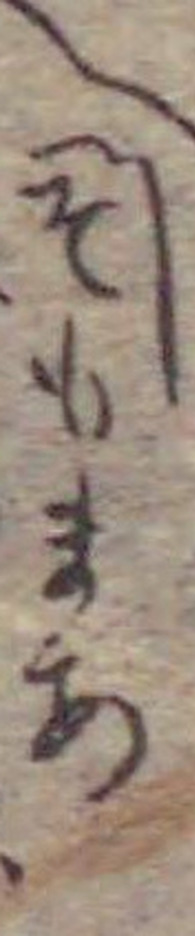〽そもまあ
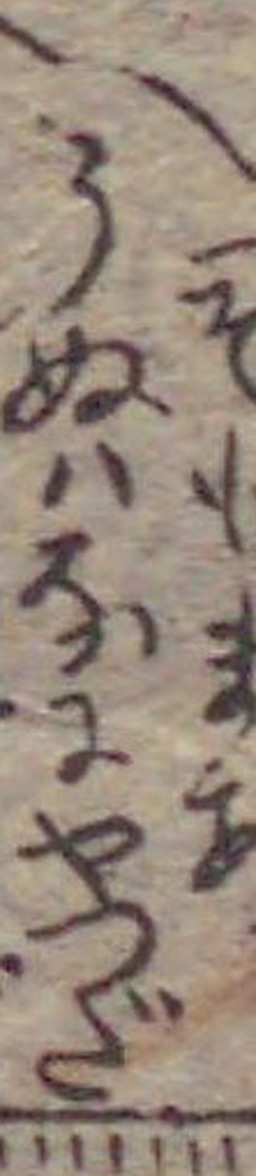うぬはなにやつだ
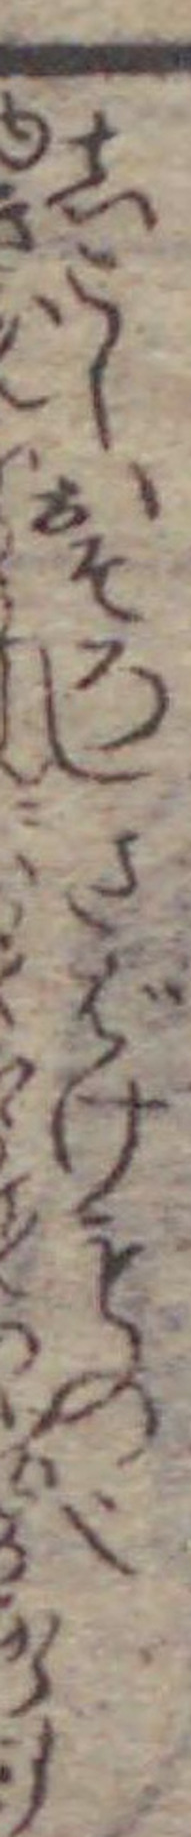しこくおそろしきばけもの也
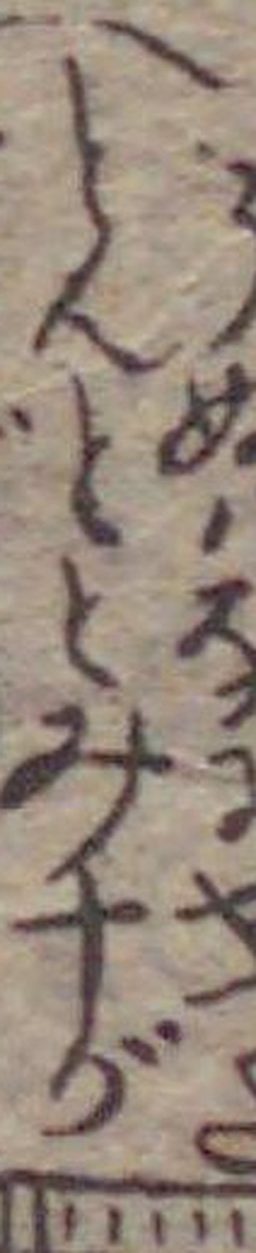とんととみ十が
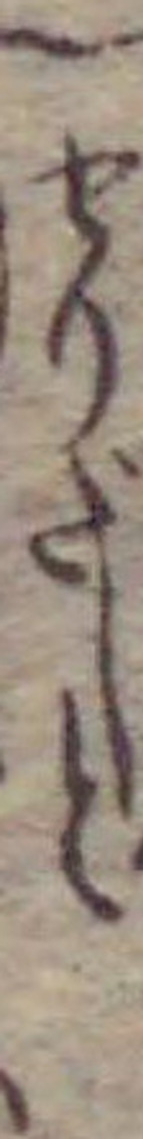せりだした
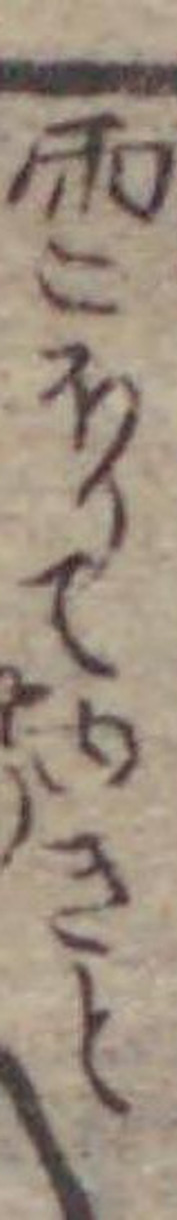雨こほりてゆきと
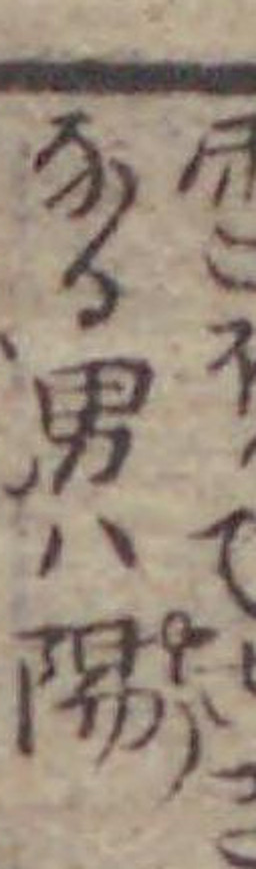なる男は陽
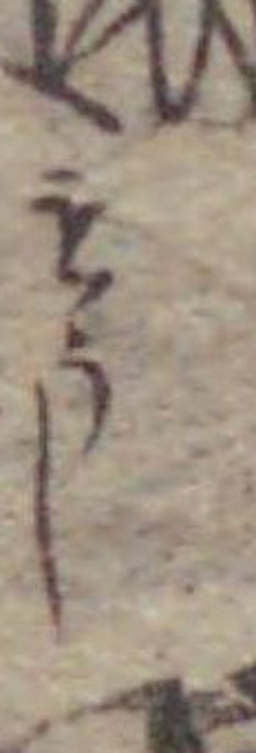もうし
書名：妖怪仕内評判記 : 2巻
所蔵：国立国会図書館 National Diet Library, JAPAN
